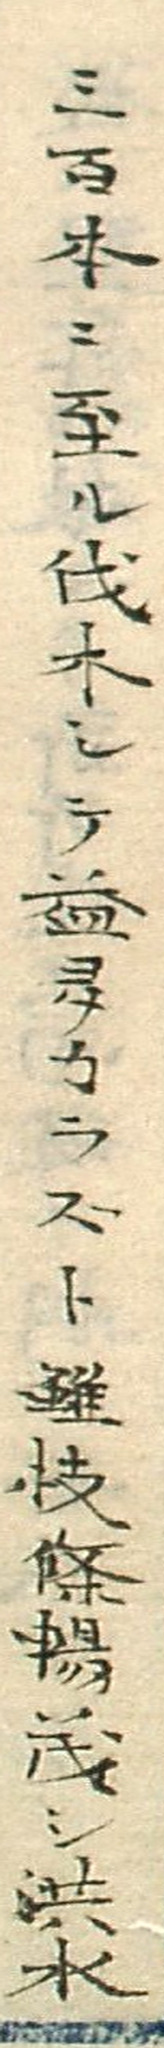三百本ニ至ル伐木シテ益多カラズト雖枝条暢茂シ洪水
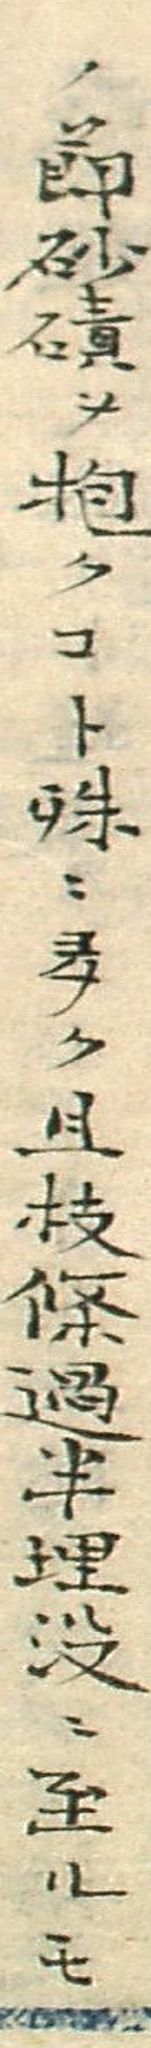ノ節砂磧ヲ抱クコト殊ニ多ク且枝条過半埋没ニ至ルモ
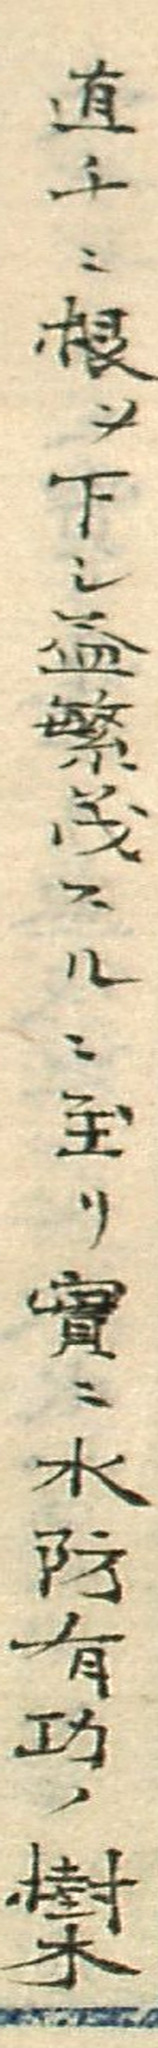直チニ根ヲ下シ益繁茂スルニ至リ実ニ水防有功ノ樹木
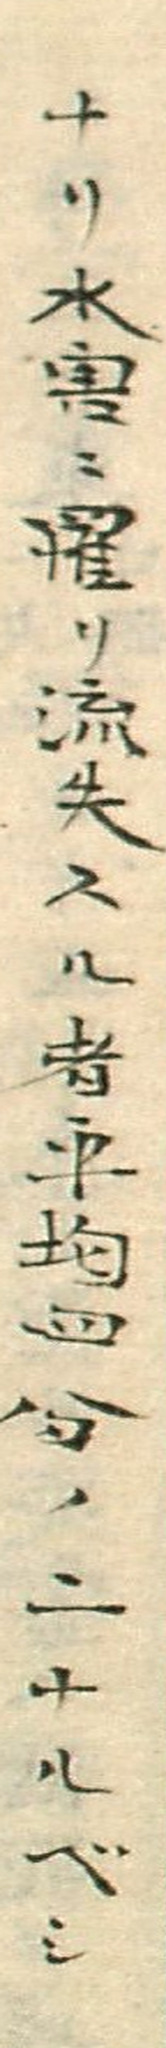ナリ水害ニ罹リ流失スル者平均四分ノ二ナルベシ
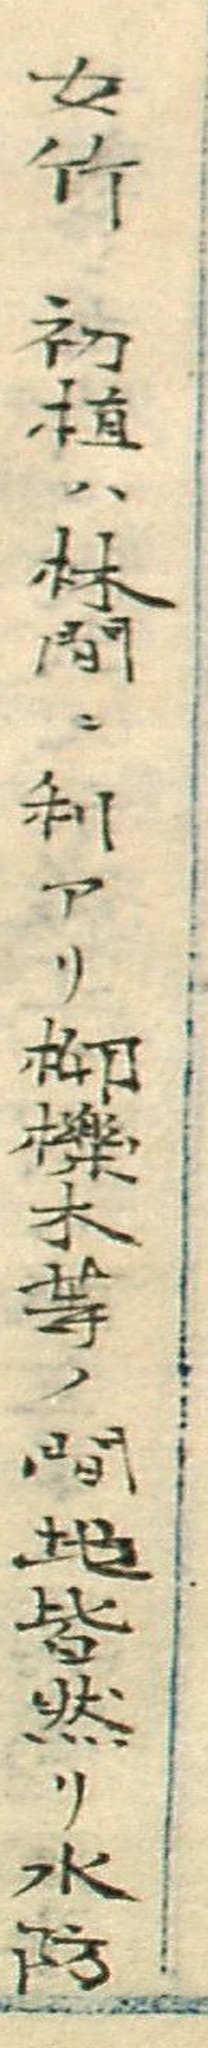女竹初植ハ林間ニ利アリ柳櫟木等ノ間地皆然リ水防
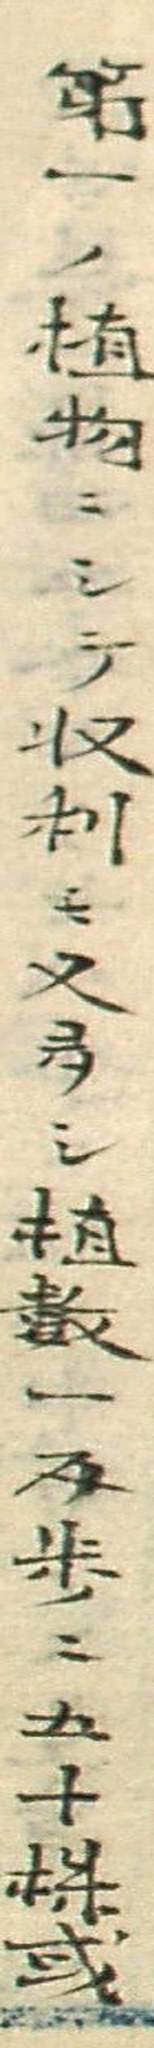第一ノ植物ニシテ収利モ又多シ植数一反歩ニ五十株或

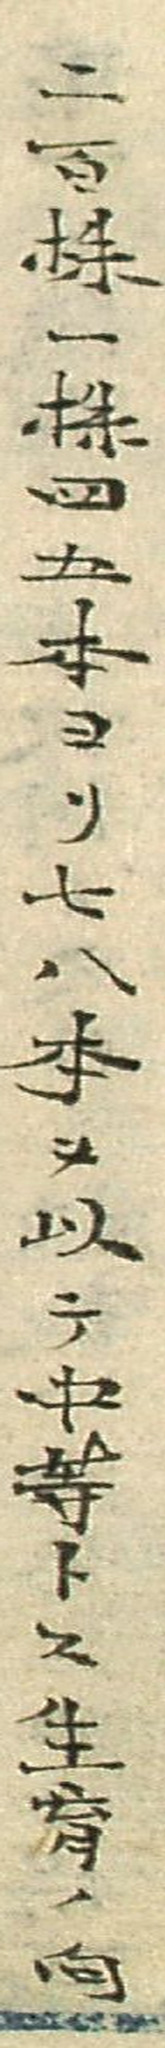二百株一株四五本ヨリ七八本ヲ以テ中等トス生育ノ向
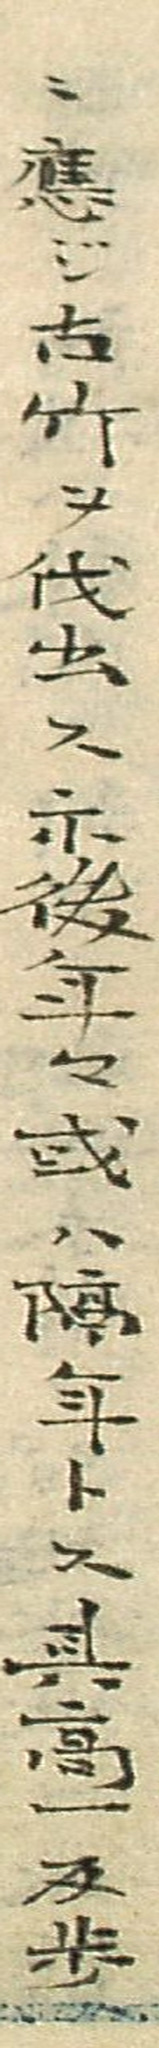ニ応ジ古竹ヲ伐出ス示後年々或ハ隔年トス其高一反歩
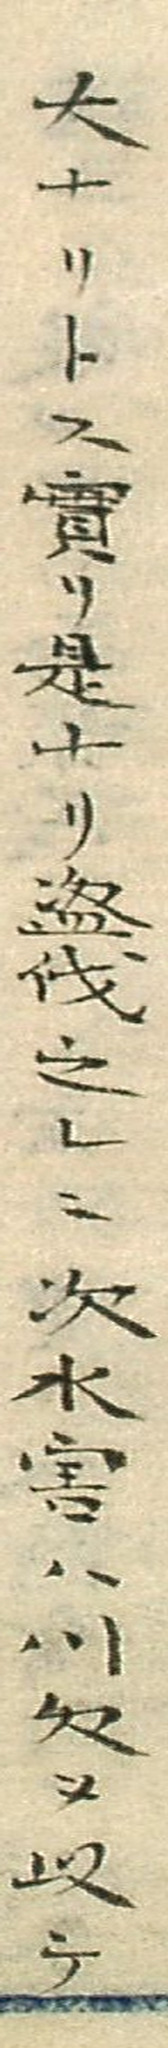大ナリトス実リ是ナリ盗伐之レニ次水害ハ川欠ヲ以テ
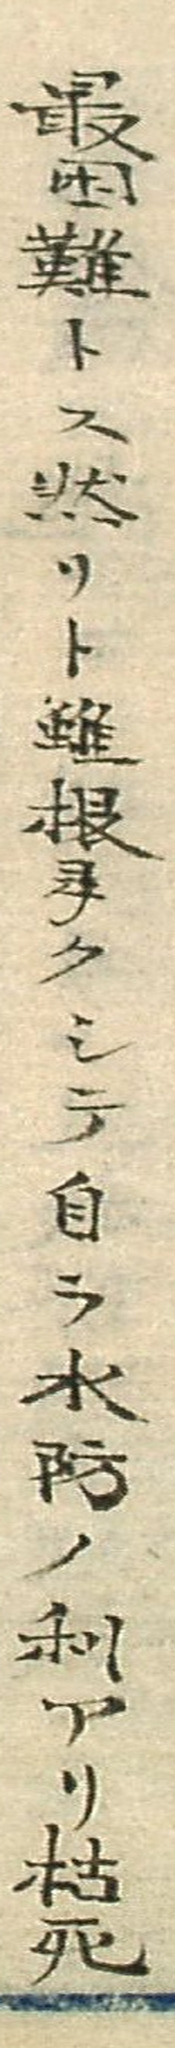最困難トス然リト雖根多クシテ自ラ水防ノ利アリ枯死
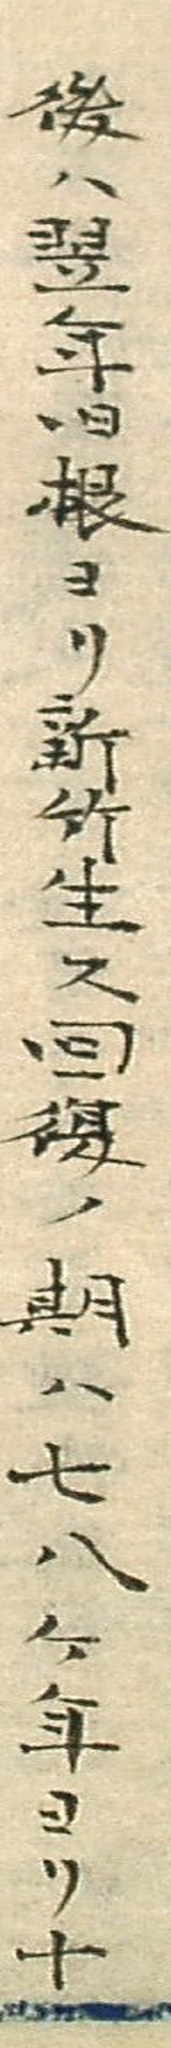後ハ翌年旧根ヨリ新竹生ス回復ノ期ハ七八ヶ年ヨリ十
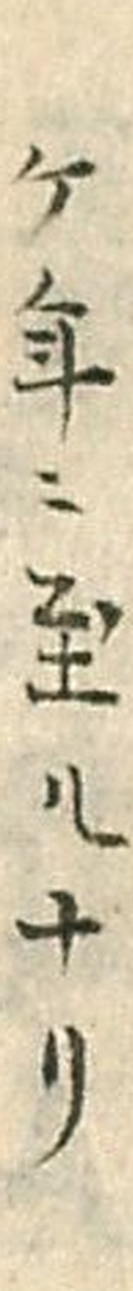ヶ年ニ至ルナリ
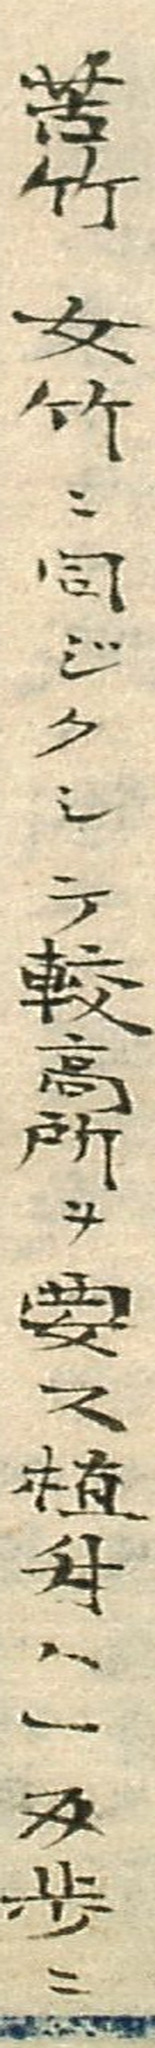苦竹女竹ニ同ジクシテ較高所ヲ要ス植付ハ一反歩ニ
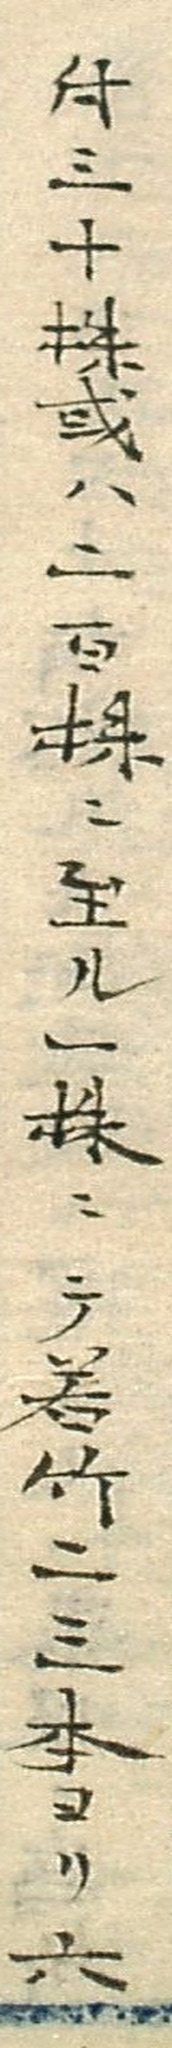付三十株或ハ二百株ニ至ル一株ニテ若竹二三本ヨリ六
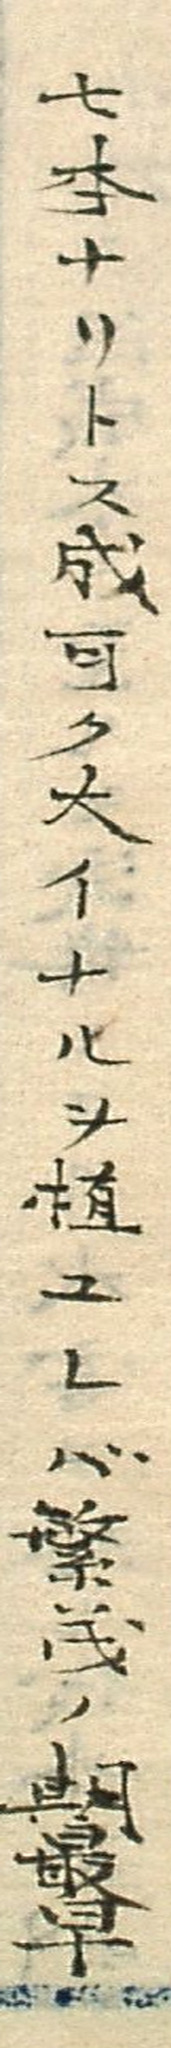七本ナリトス成可ク大イナルヲ植ユレバ繁茂ノ期最早
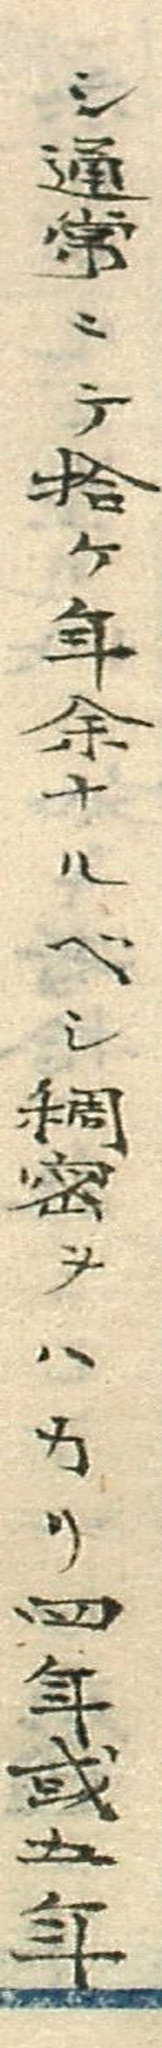シ通常ニテ拾ヶ年余ナルベシ稠密ヲハカリ四年或五年
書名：山林共進会取調書
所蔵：鳴門教育大学 Naruto University of Education
